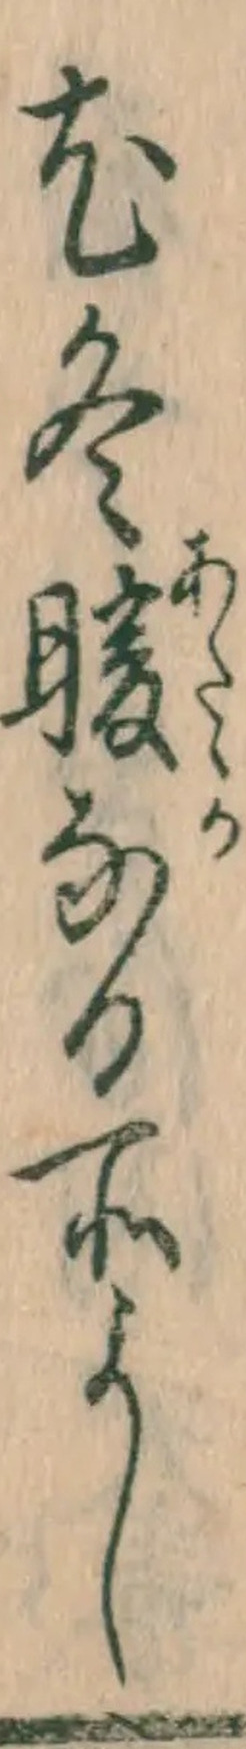尤冬暖なる所よし
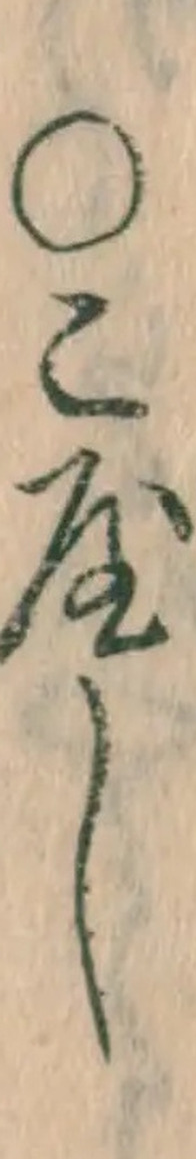○こやし
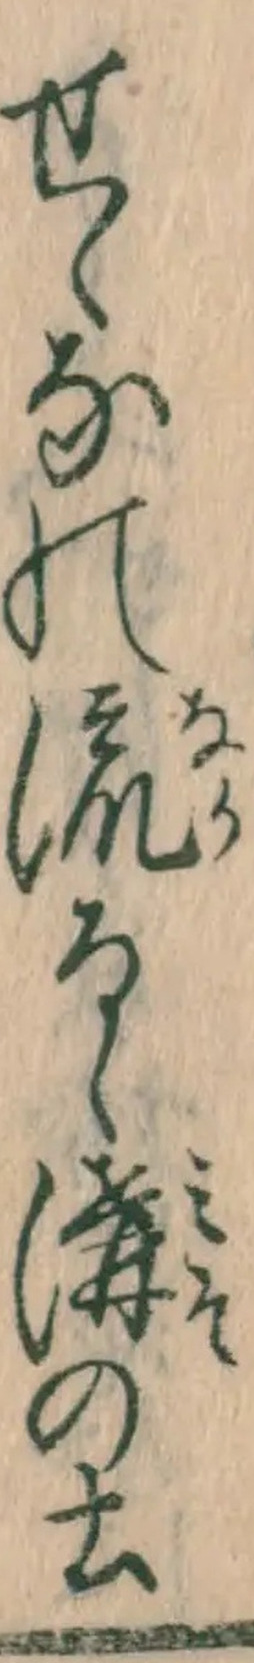せゝなの流るゝ溝の土
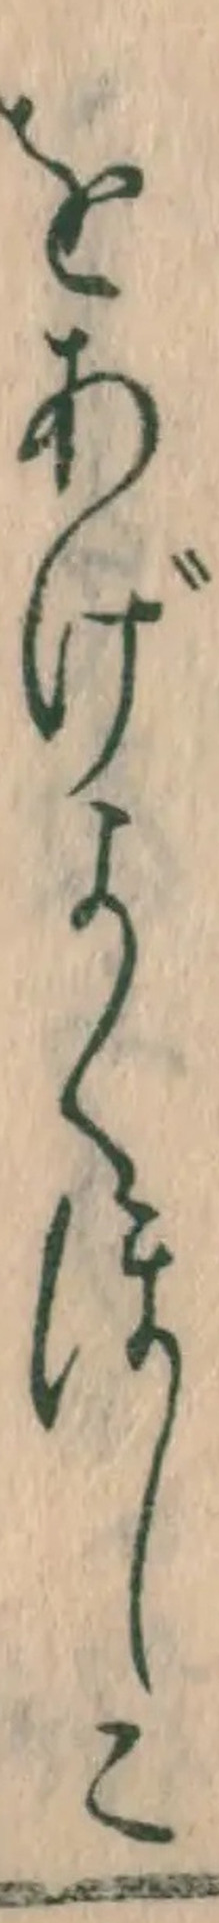をあげよくほしこ
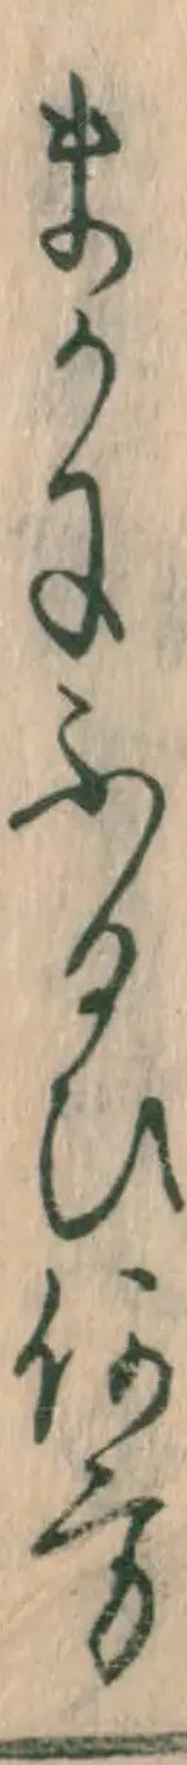まかにふるひ何方
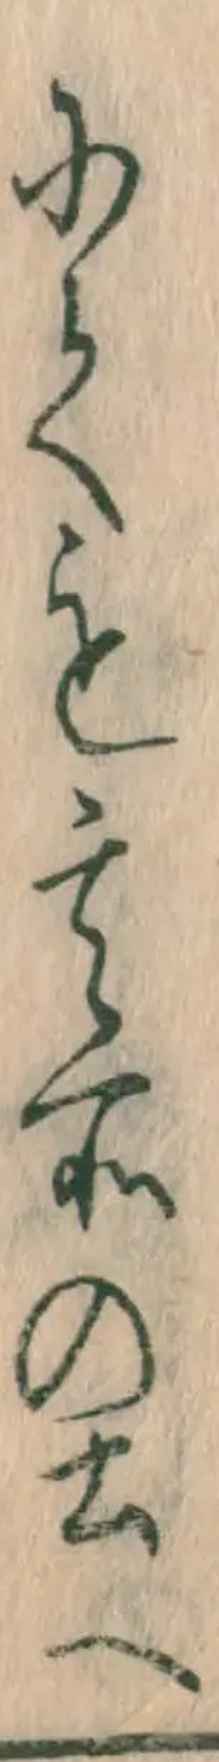にても其所の土へ
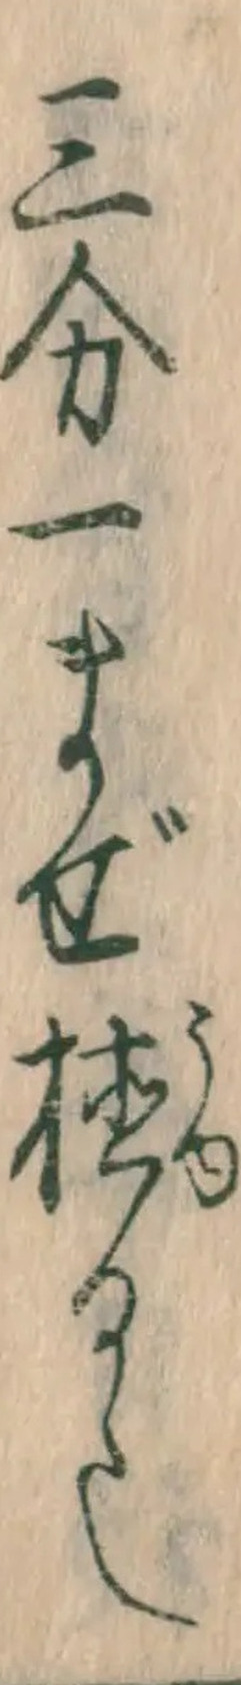三分一まぜ植る也
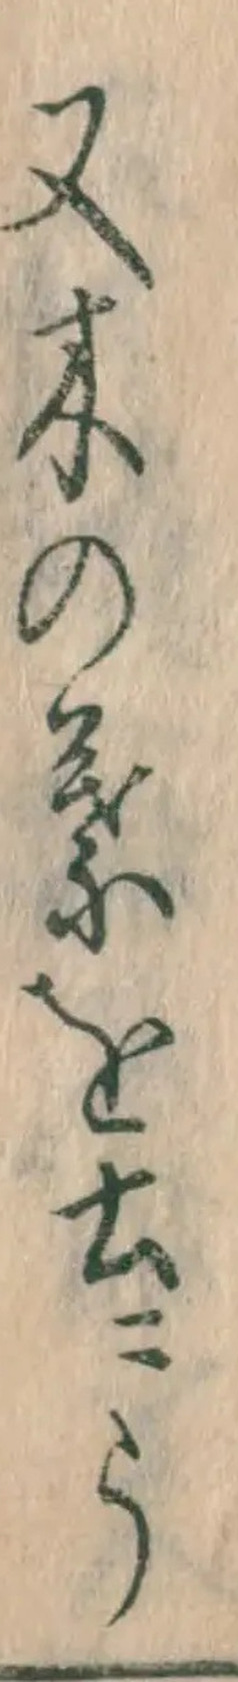又木の葉を土
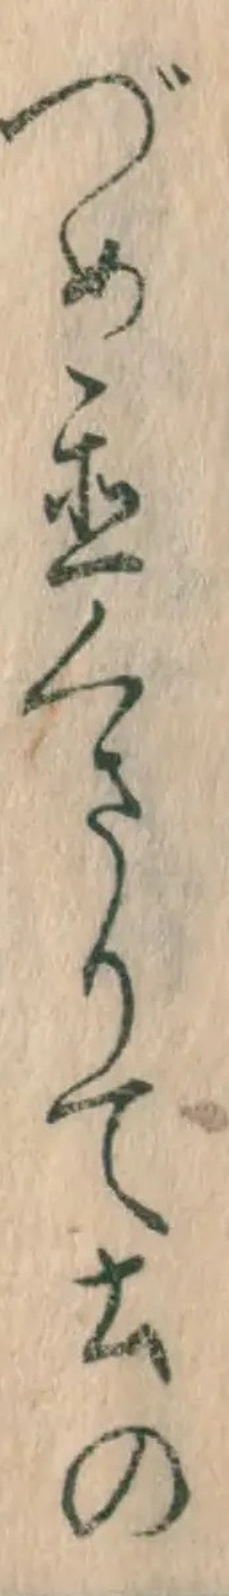づめ置くさりて土の
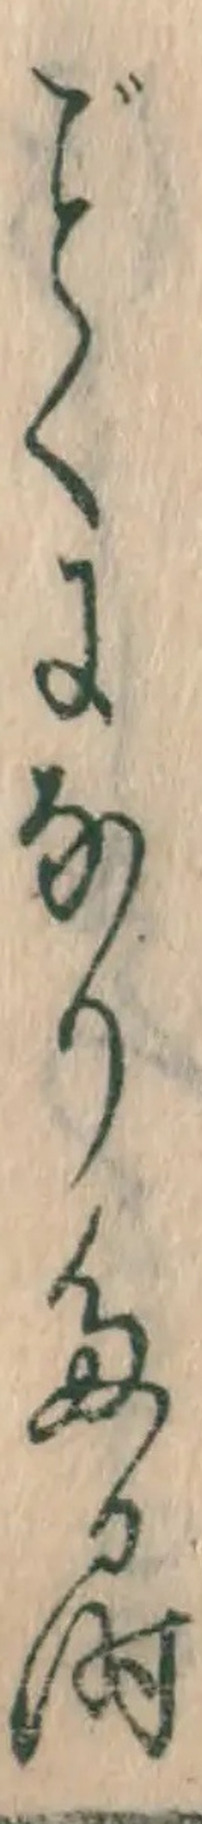ごとくになりたる時
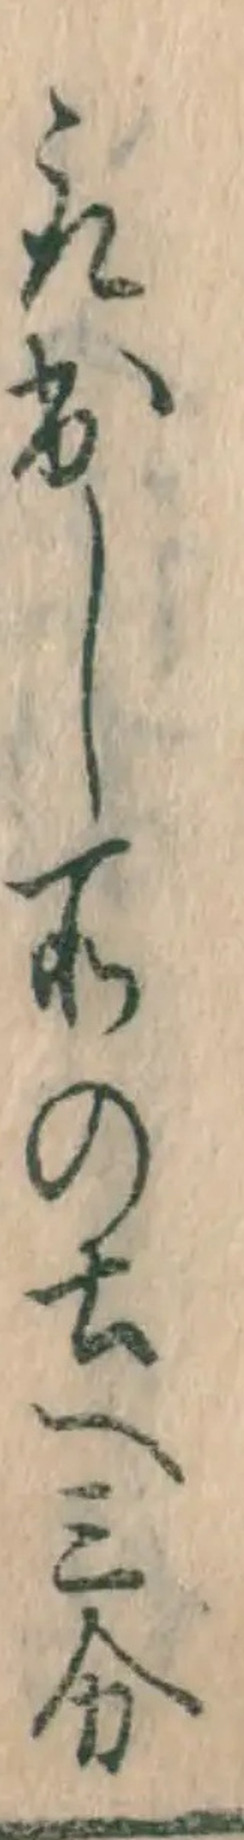取出し所の土へ三分
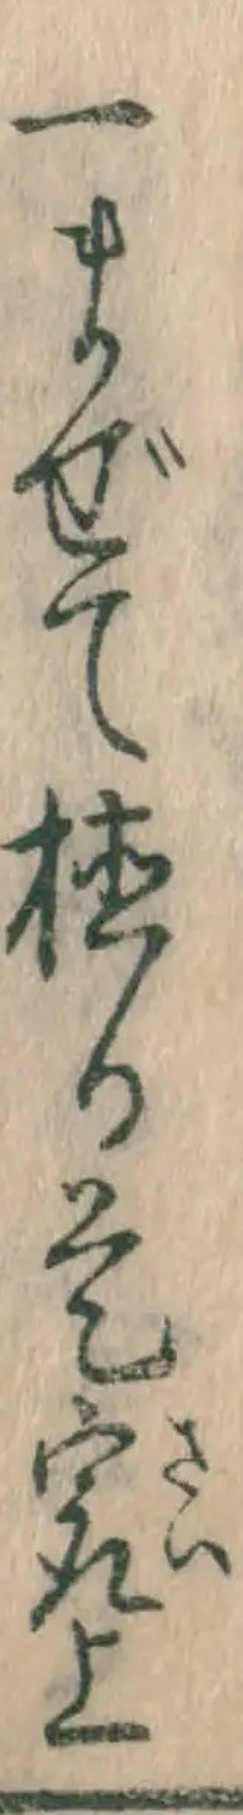一まぜて植る是最上

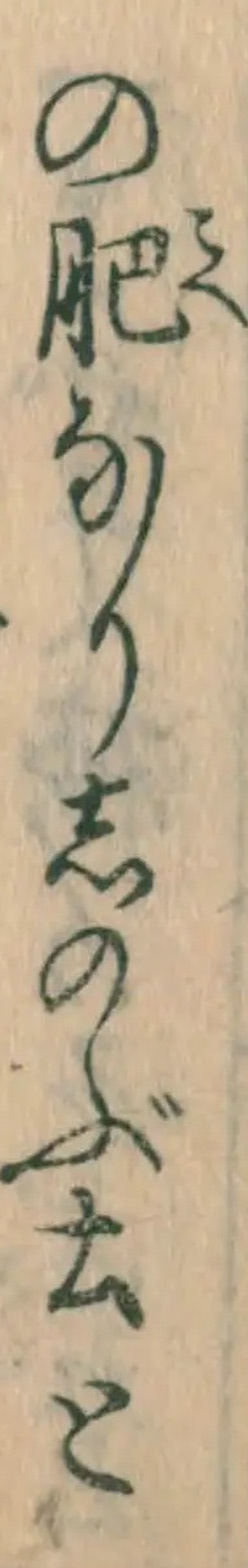の肥なりしのぶ土と
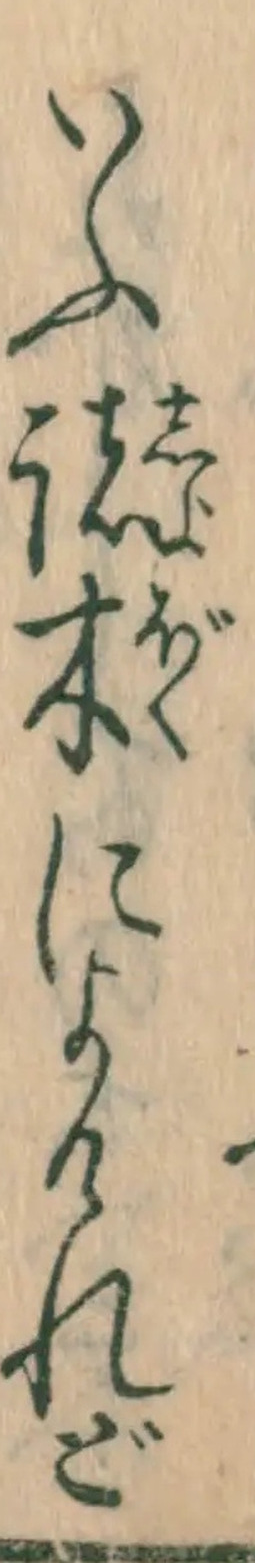いふ諸木によけれど
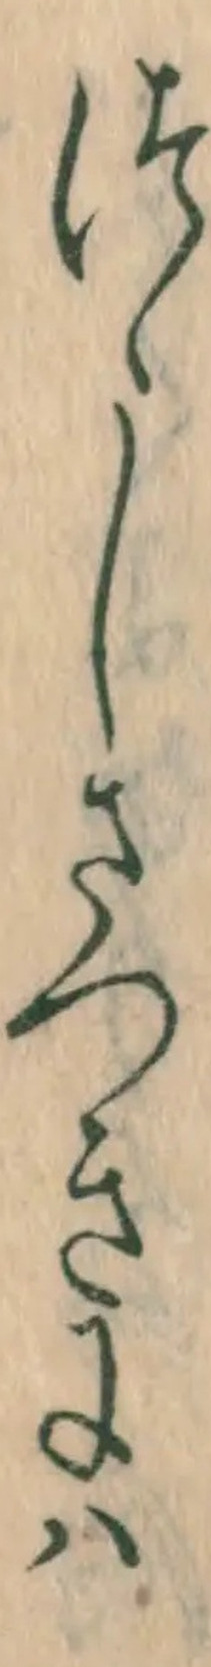つゝしさつきには
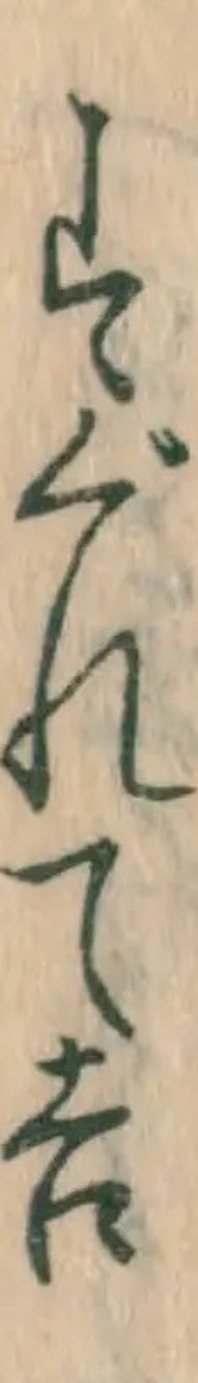すぐれて吉
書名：錦繍枕 5巻. [5]
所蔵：国立国会図書館 National Diet Library, JAPAN
